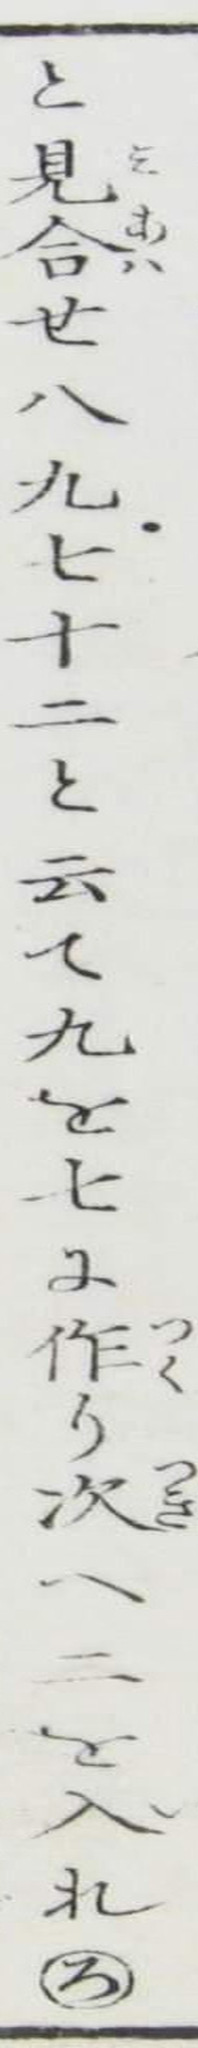と見合せ八九．七十二と云て九を七に作り次へ二を入れ㋺
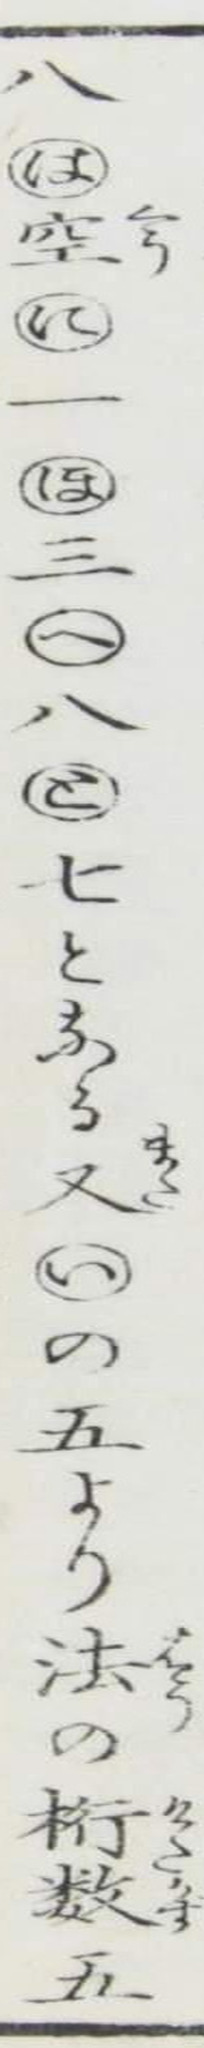八㋩空㋥一㋭三㋬八㋣七となる又㋑の五より法の桁数五
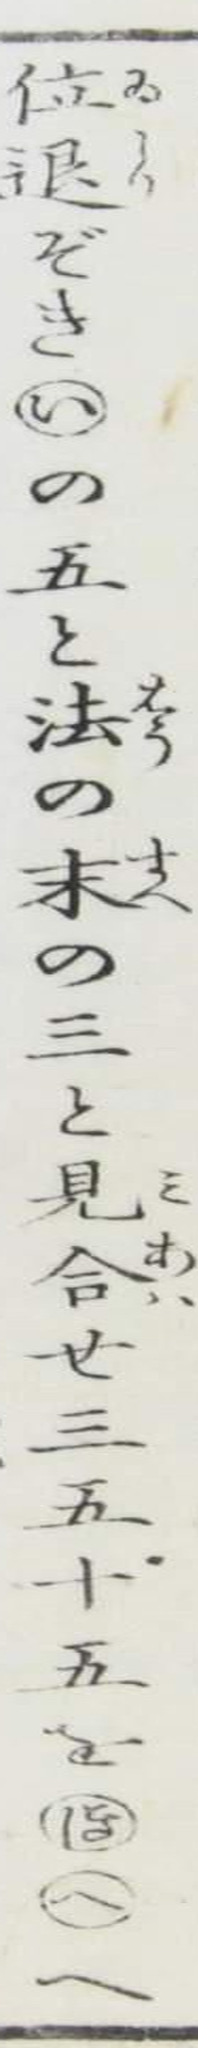位退ぞき㋑の五と法の末の三と見合せ三五．十五を㋭㋬へ
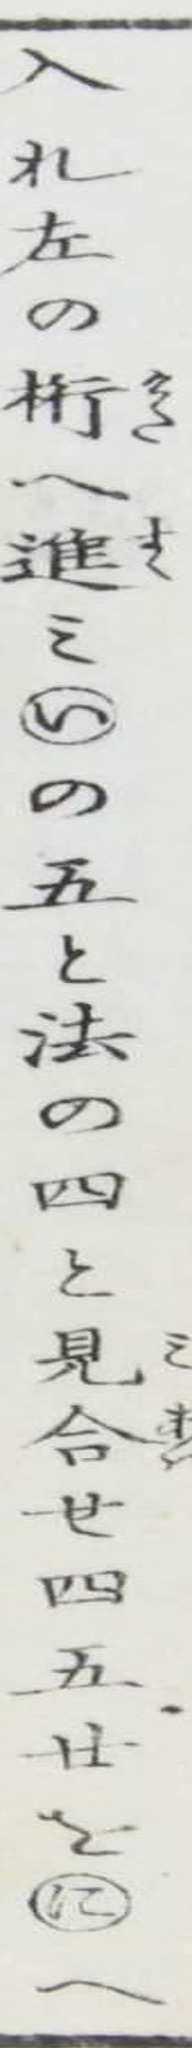入れ左の桁へ進み㋑の五と法の四と見合せ四五．廿を㋥へ
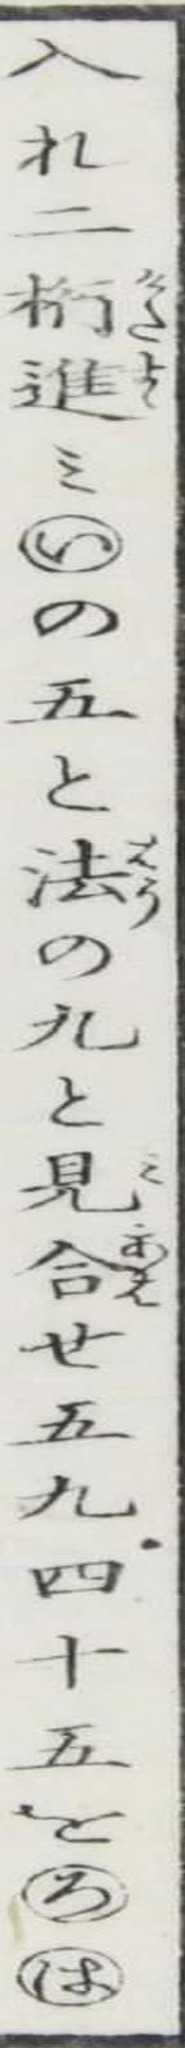入れ二桁進み㋑の五と法の九と見合せ五九．四十五を㋺㋩
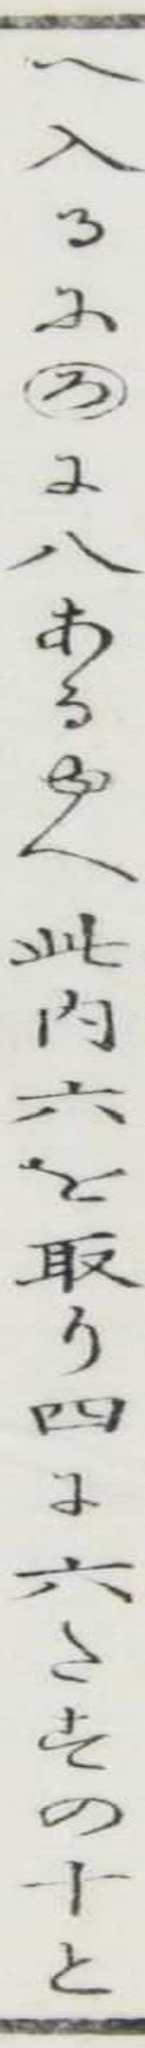へ入るに㋺に八あるゆへ此内六を取り四に六たすの十と
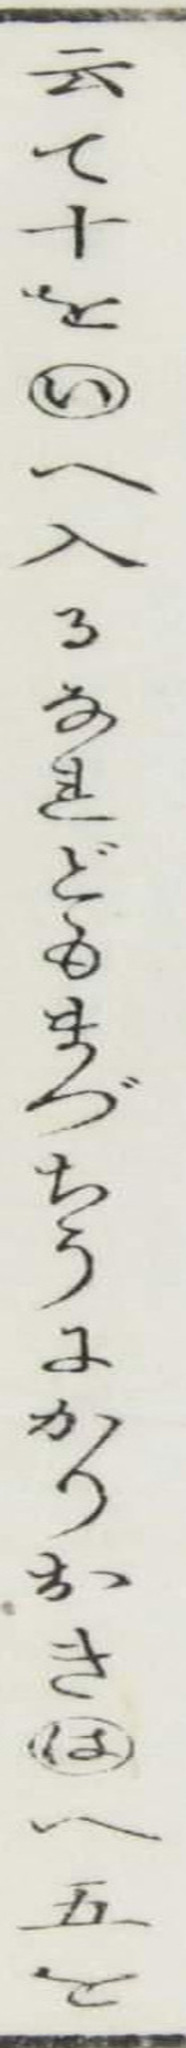云て十を㋑へ入るなれどもまづちうにかりおき㋩へ五を
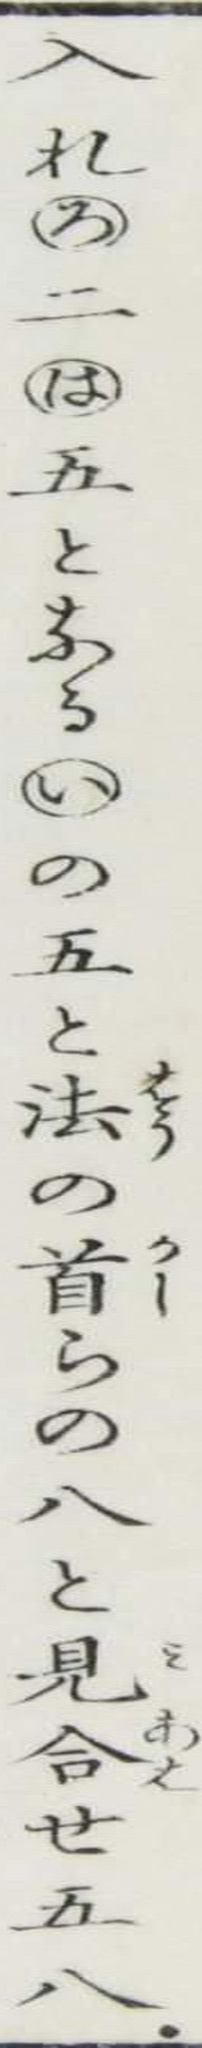入れ㋺二㋩五となる㋑の五と法の首らの八と見合せ五八．
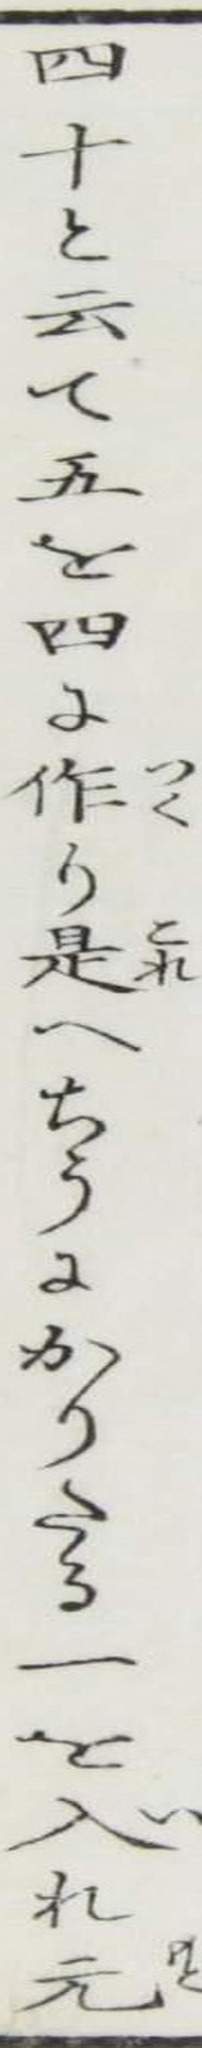四十と云て五を四に作り是へちうにかりたる一を入れ元
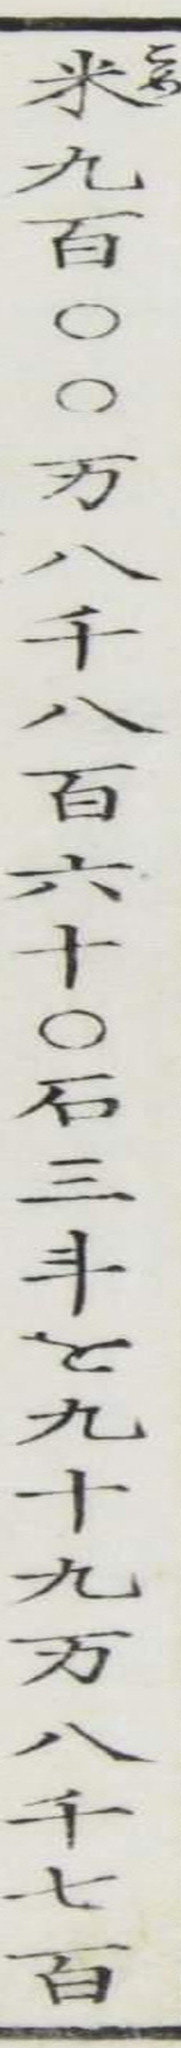米九百〇〇万八千八百六十〇石三斗を九十九万八千七百
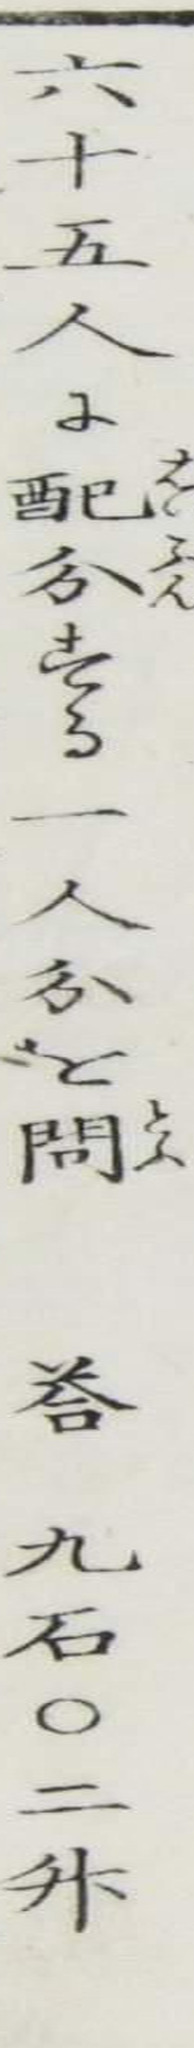六十五人に配分する一人分を問答九石〇二升
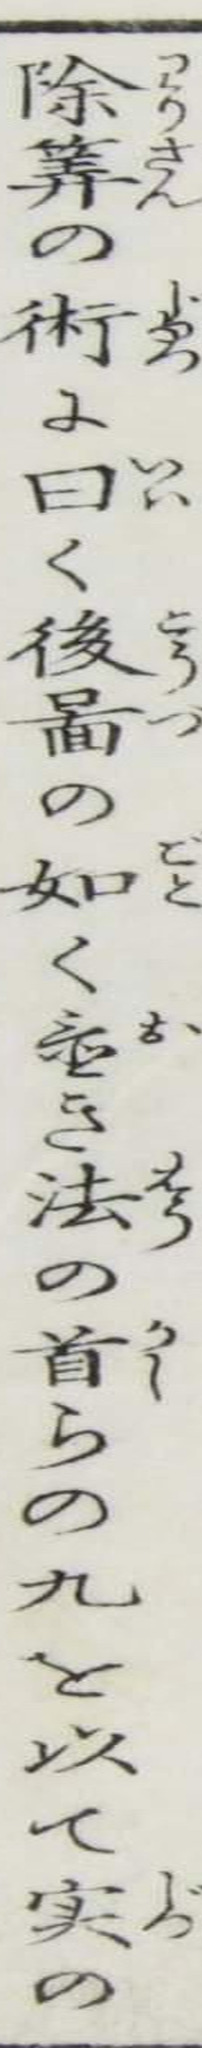除算の術に曰く後図の如く置き法の首らの九を以て実の
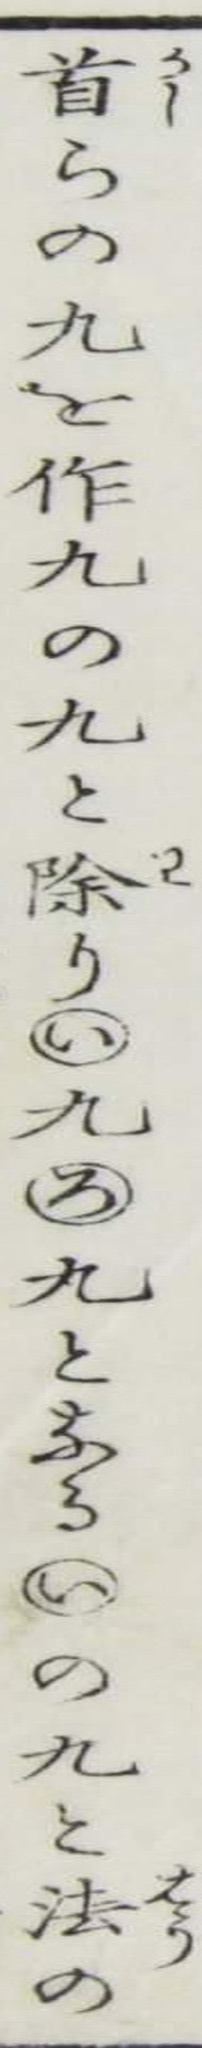首らの九を作九の九と除り㋑九㋺九となる㋑の九と法の
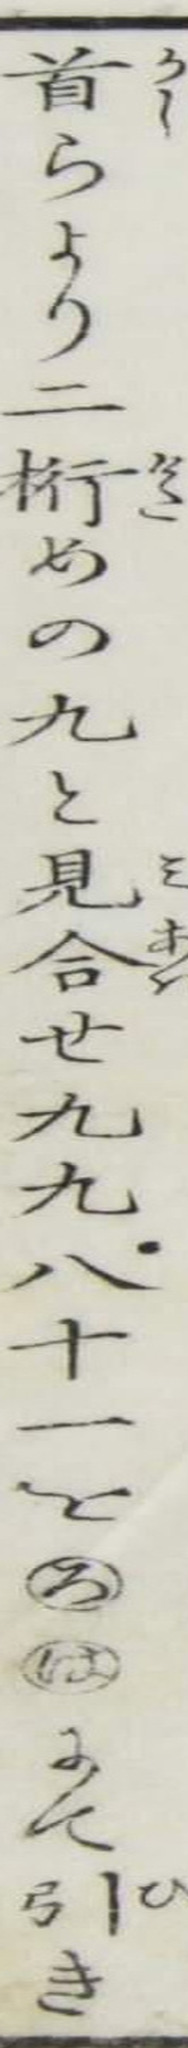首より二桁めの九と見合せ九九．八十一を㋺㋩にて引き

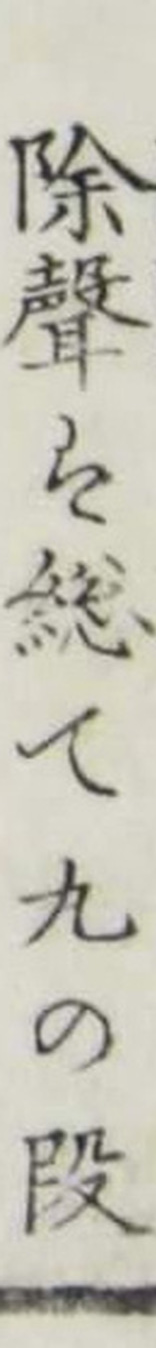除声は総て九の段
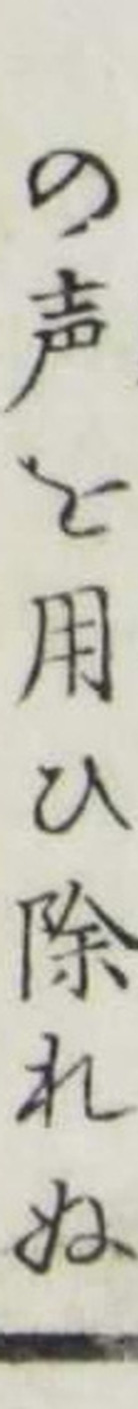の声を用ひ除れぬ
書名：明治小學塵劫記 卷1
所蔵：東京学芸大学教育コンテンツアーカイブ
